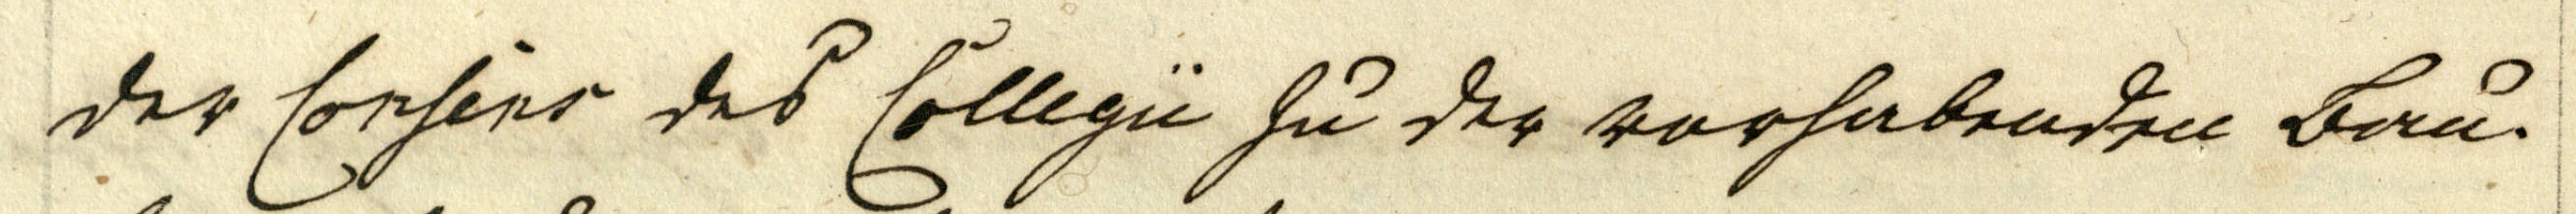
der Consens des Collegii zu der vorhabenden Bau-
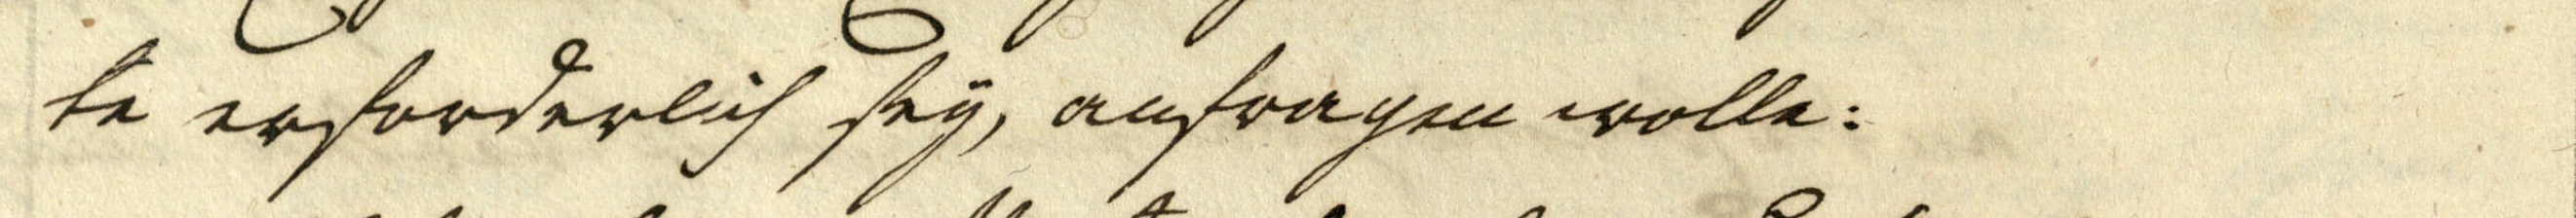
te erforderlich sey, anfragen wolle:
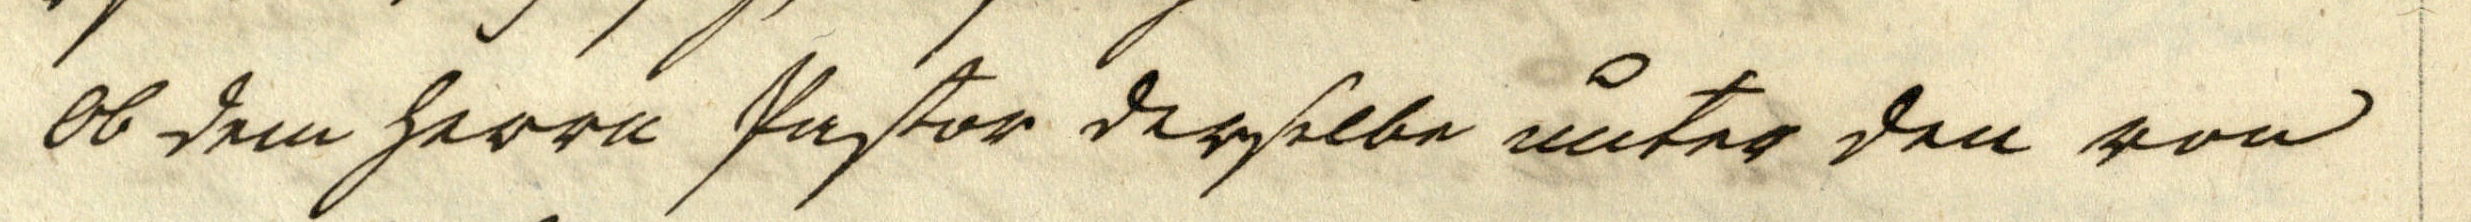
Ob dem Herrn Pastor derselbe unter den von
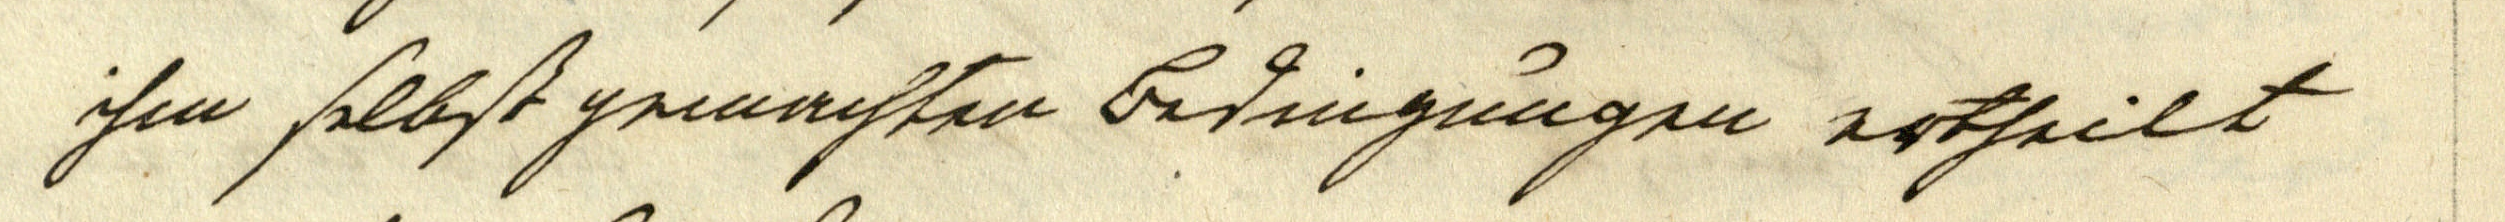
ihm selbst gemachten Bedingungen ertheilt
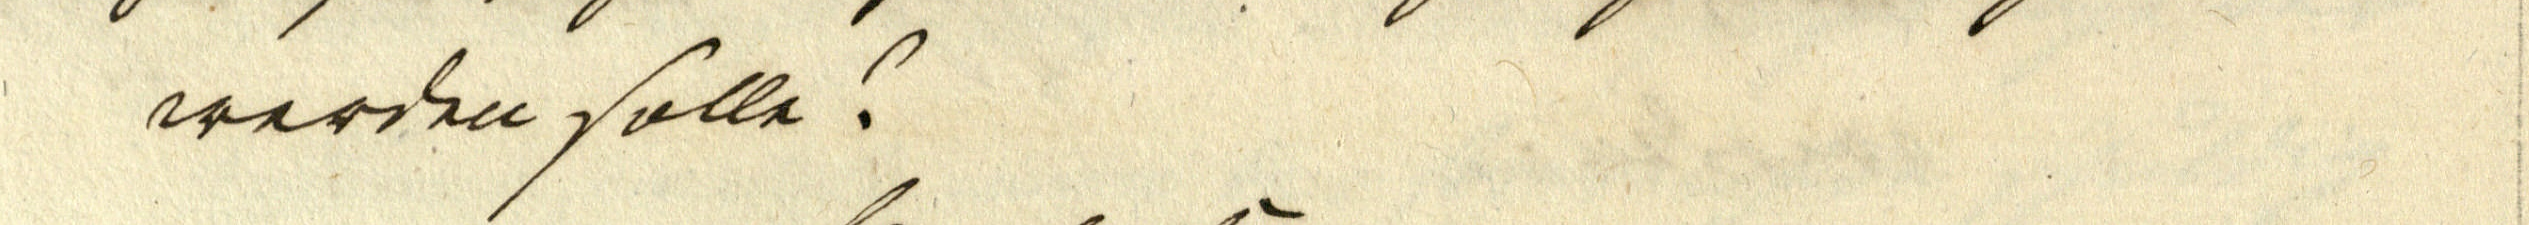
werden solle?
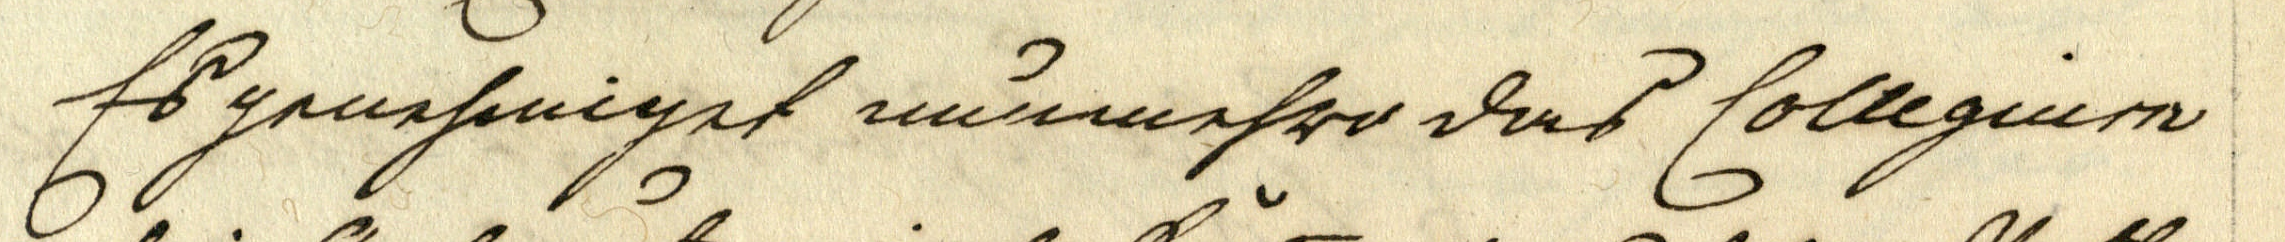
Es genehmiget nunmehro das Collegium
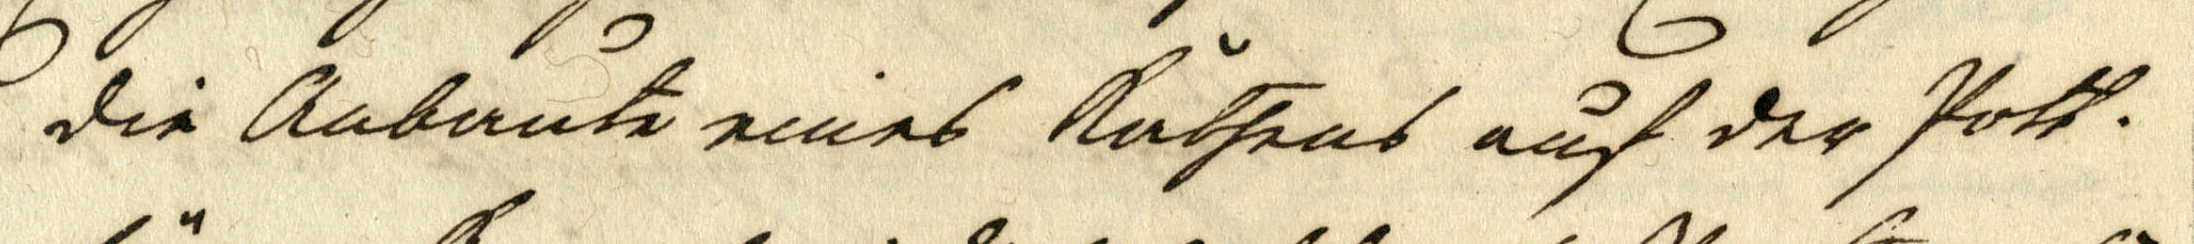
die Anbaute eines Kathens auf der Pott-
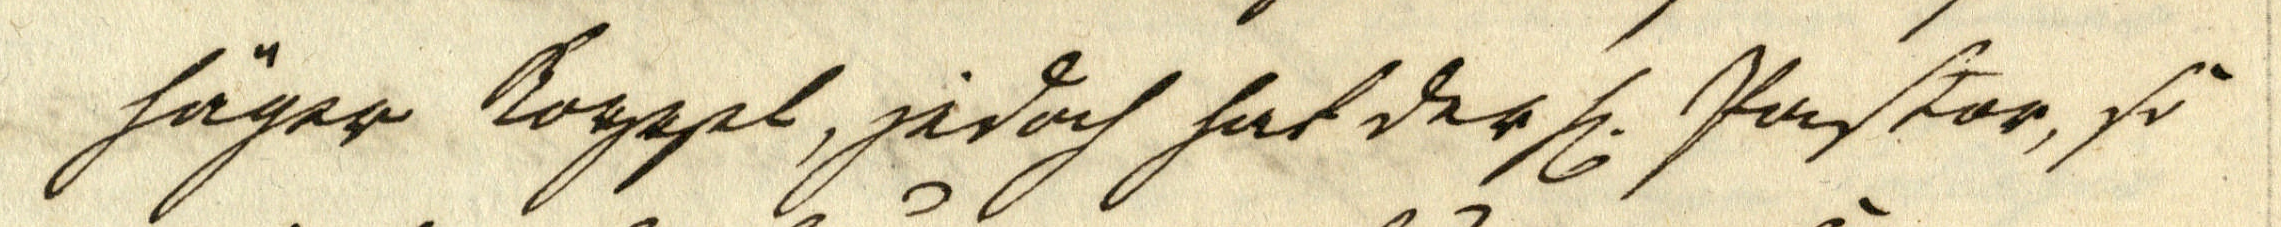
häger Koppel, jedoch hat der h. Pastor, so
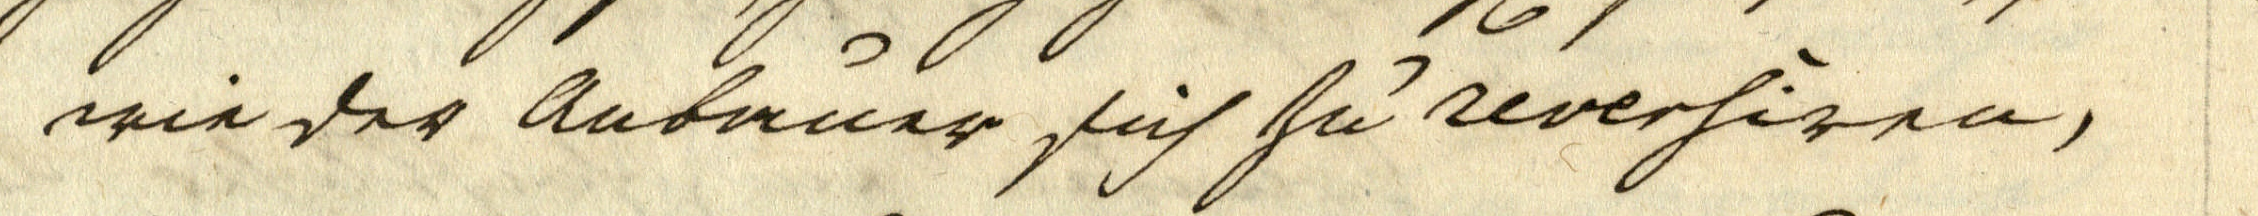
wie der Anbauer sich zu reversiren,
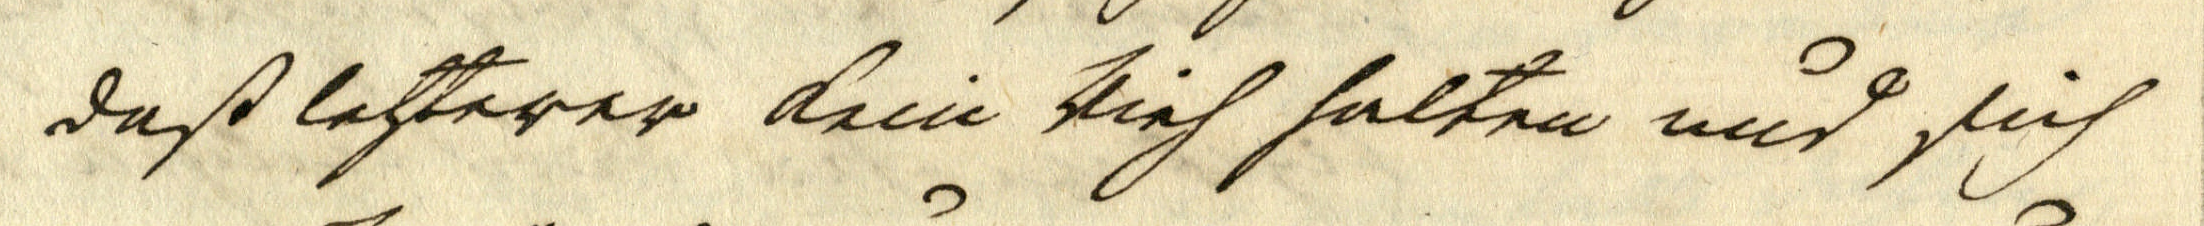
daß letzterer kein Vieh halten und sich
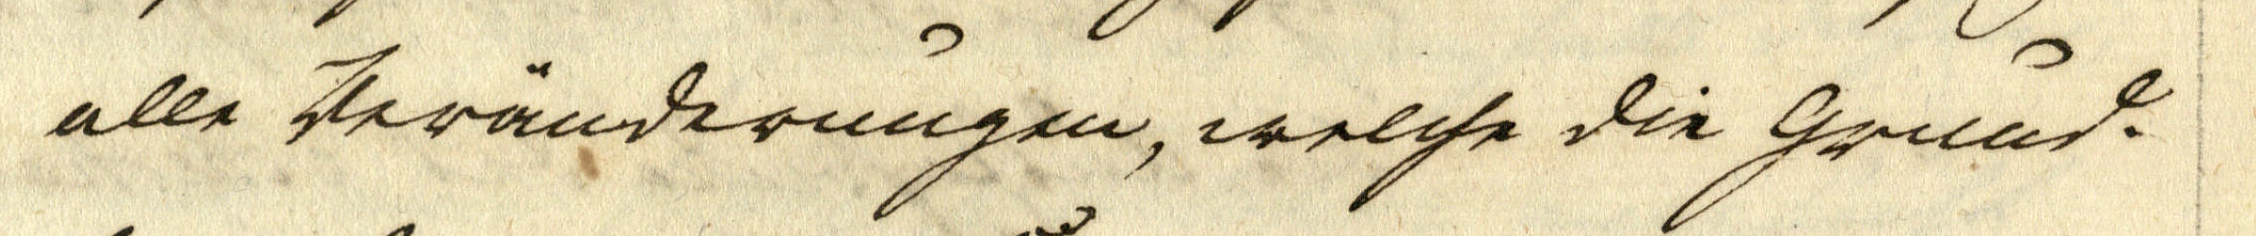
alle Veränderungen, welche die Grund-
